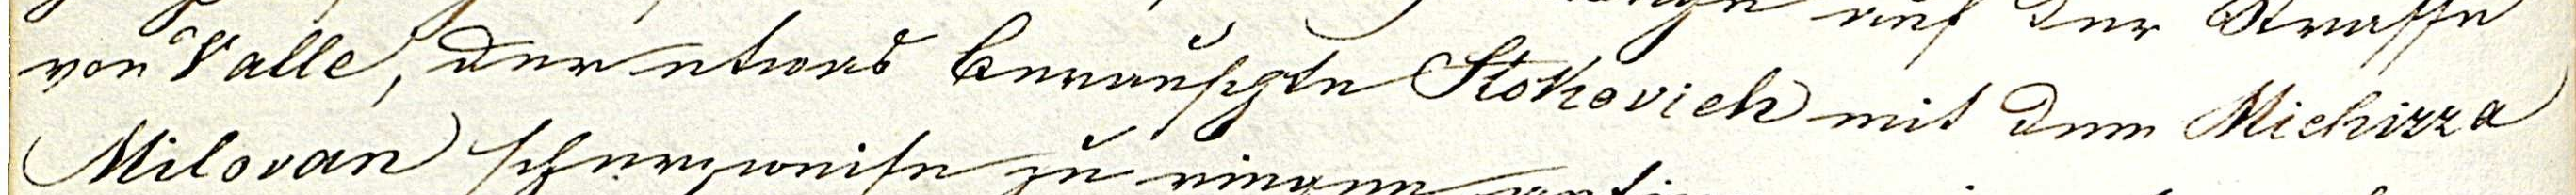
von Valle, der etwas berauschte Stokovich mit dem Michizza
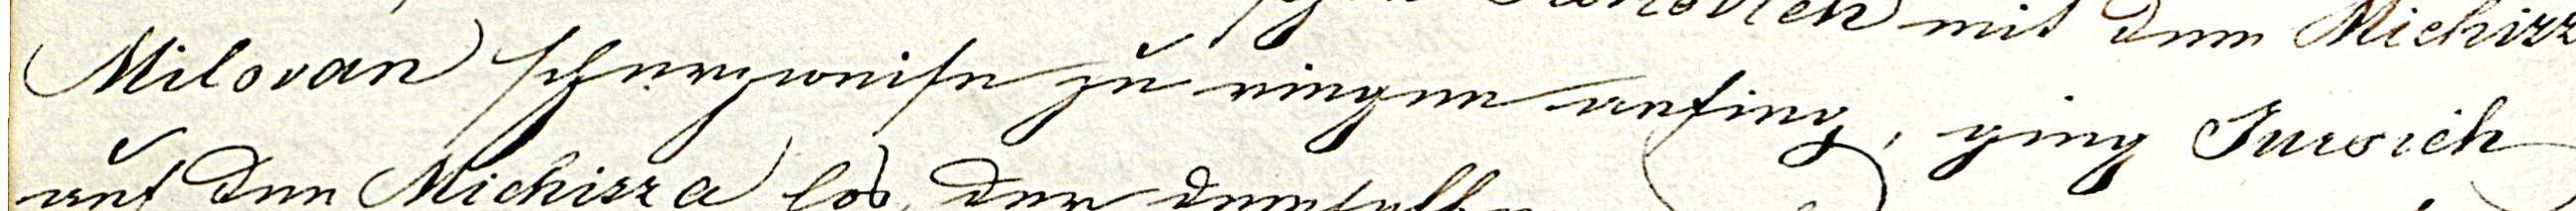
Milovan scherzweise zu ringen anfing, ging Jursich
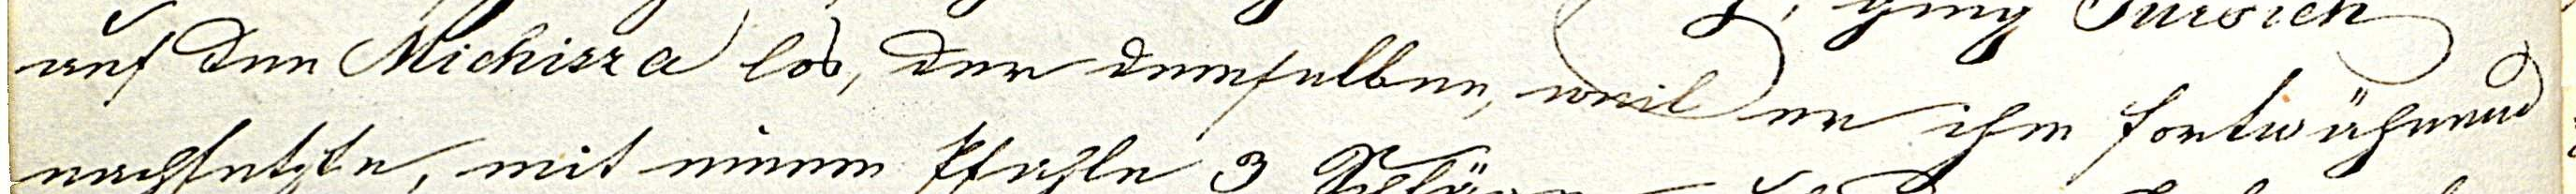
auf den Michizza los, der demselben, weil er ihm fortwährend
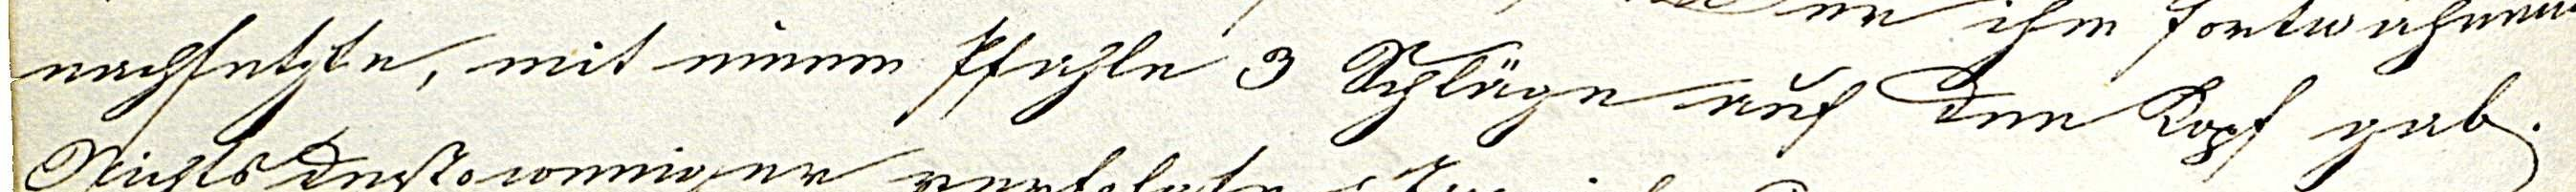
nachsetzte, mit einem Pfahle 3 Schläge auf den Kopf gab.
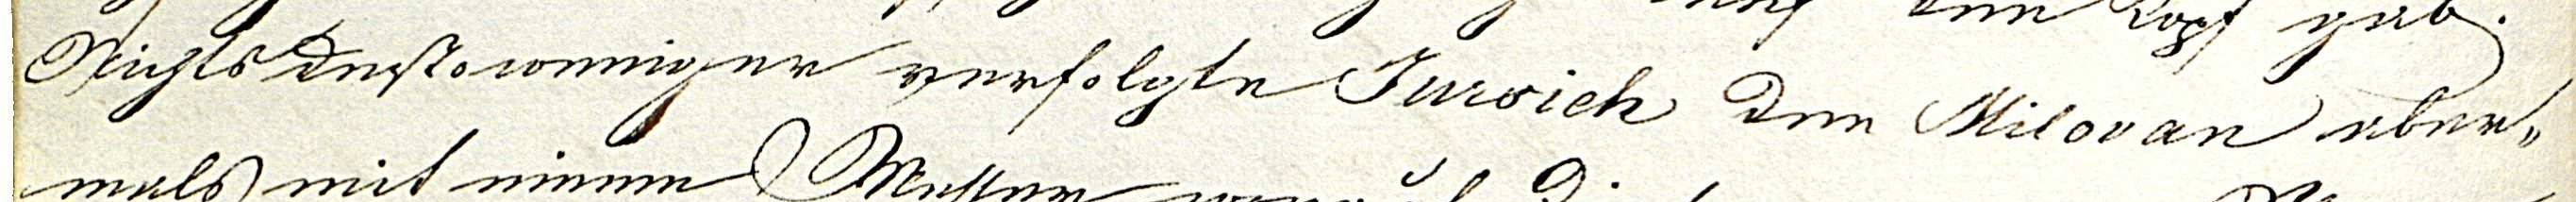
Nichts desto weniger verfolgte Jursich den Milovan aber¬
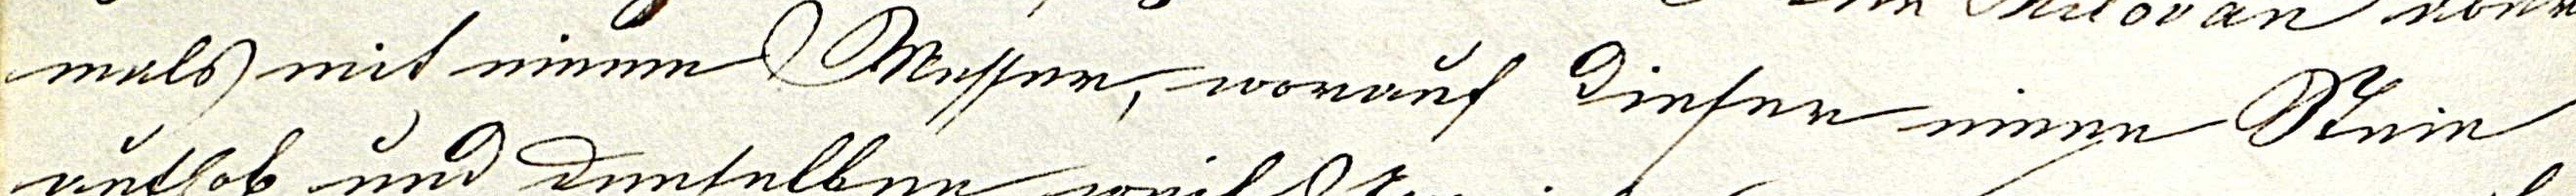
mals mit einem Messer worauf dieser einen Stein
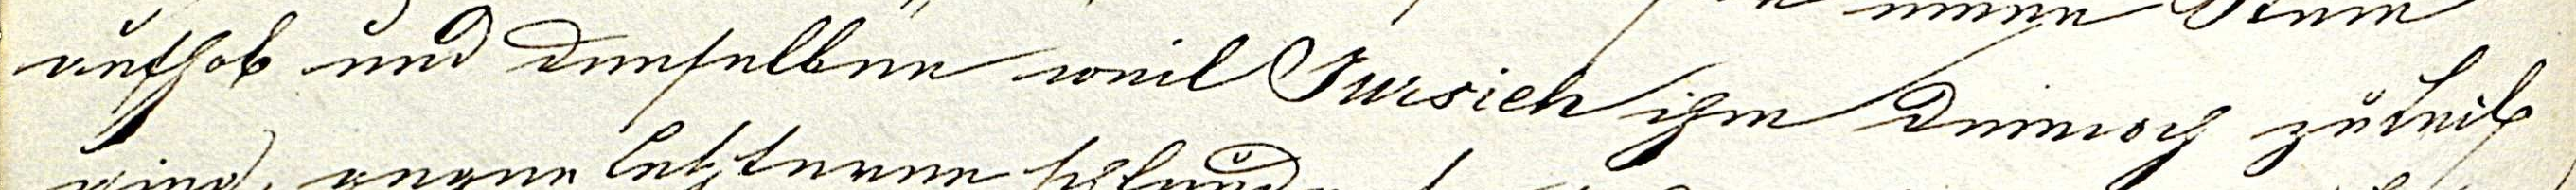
aufhob und denselben weil Jursich ihm demnoch zu Leib¬
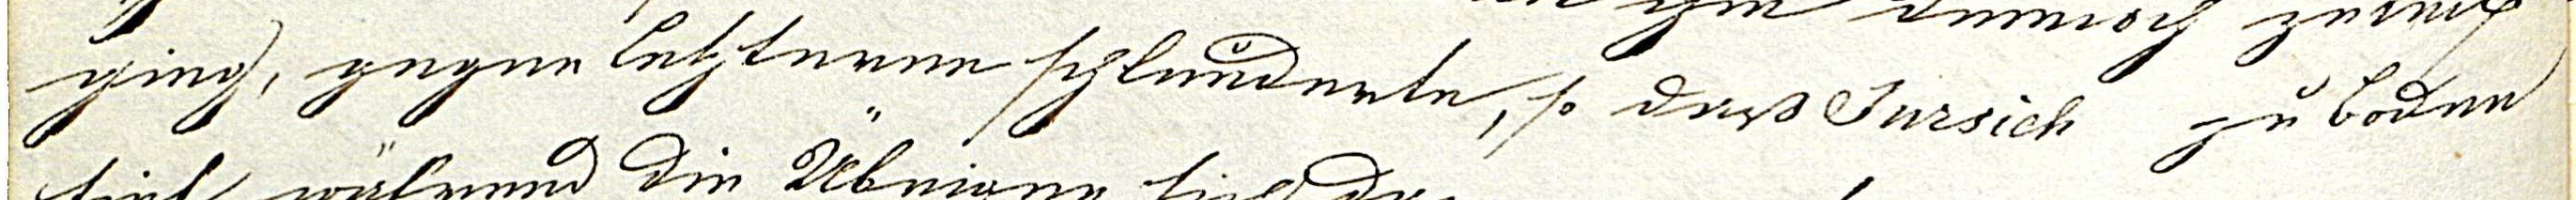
ging, gegen letzteren schleuderte, so daß Jursich zu Boden
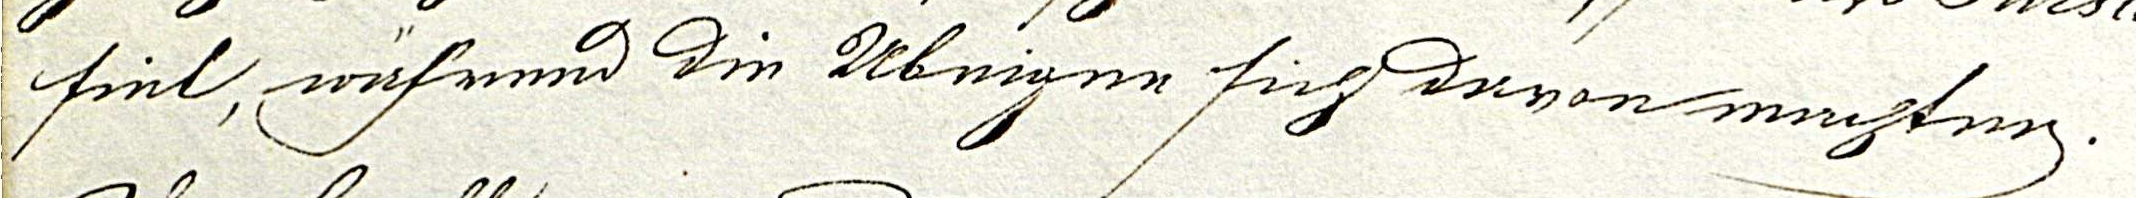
fiel, während die Übrigen sich davon machten.
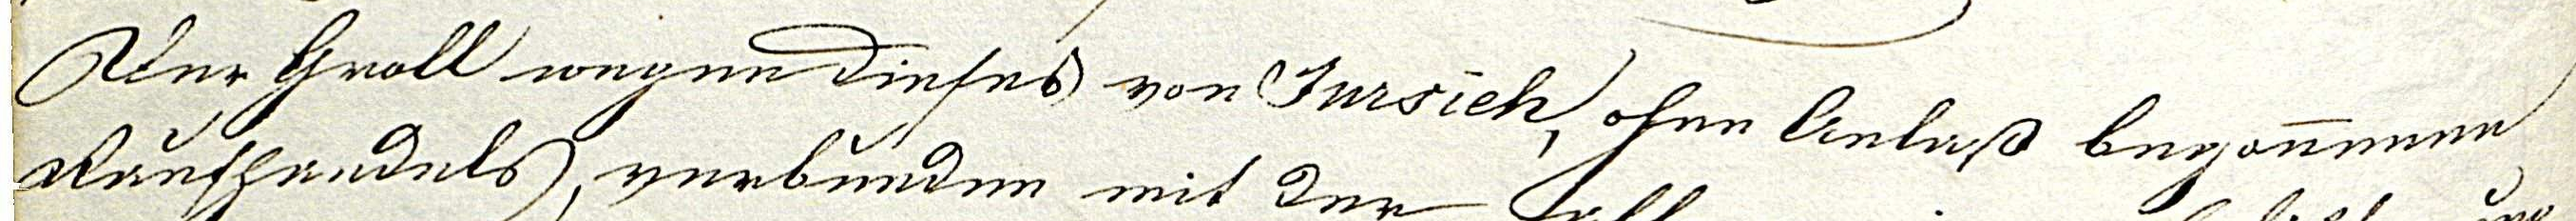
Der Groll wegen dieses von Jursich, ohne Anlaß begonnen
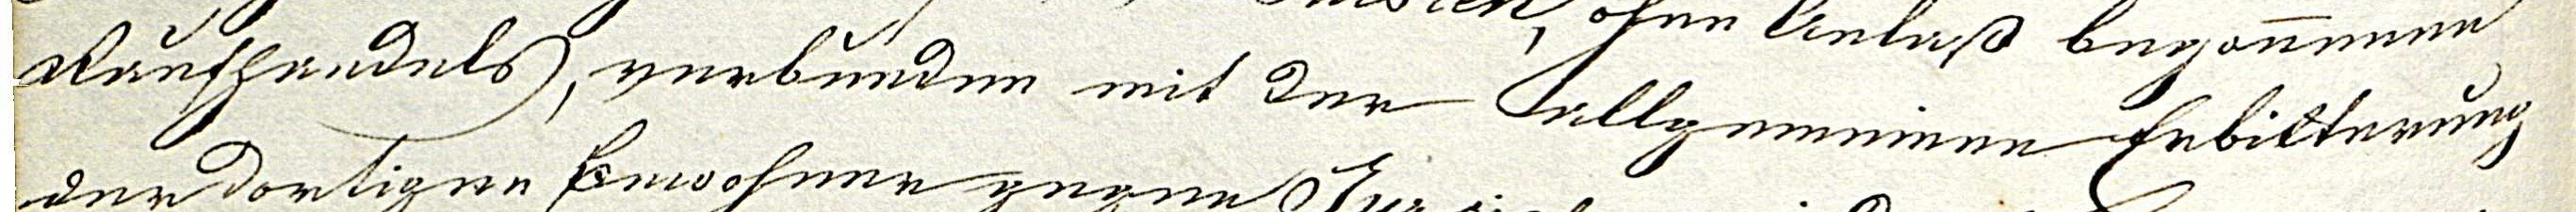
Raufhandels, verbunden mit der allgemeinen Erbitterung
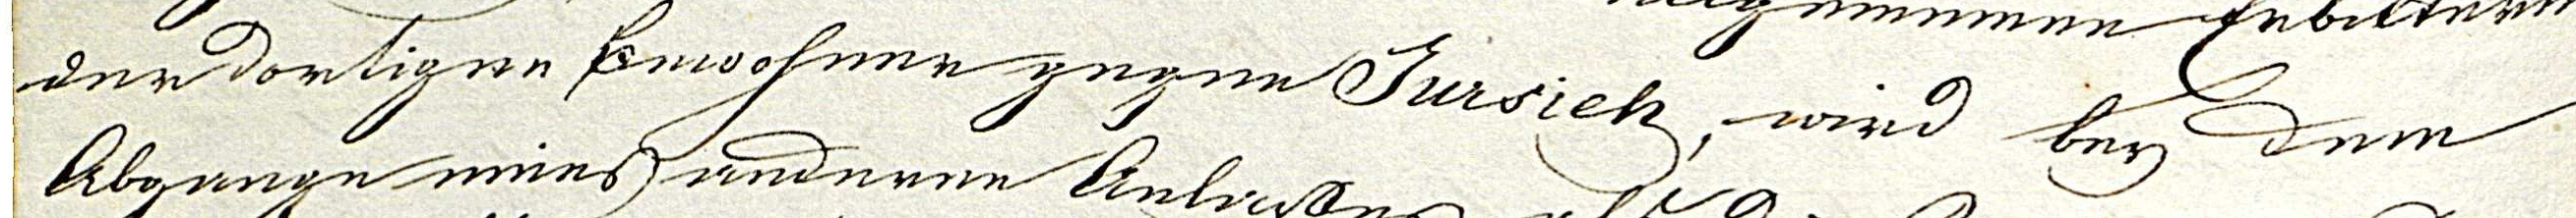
der dortigen Bewohner gegen Jursich, wird bey dem
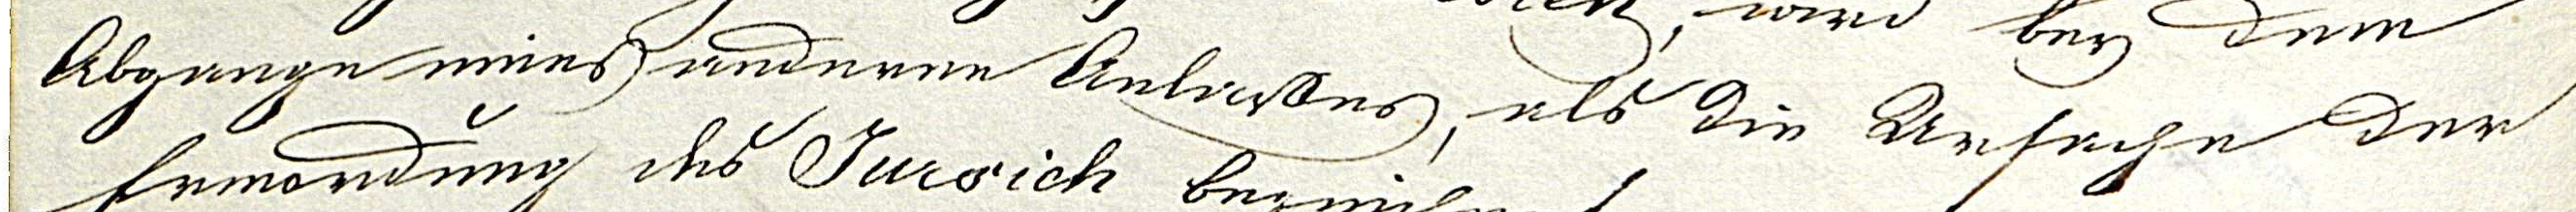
Abgange eines anderen Anlaßes, als die Ursache der
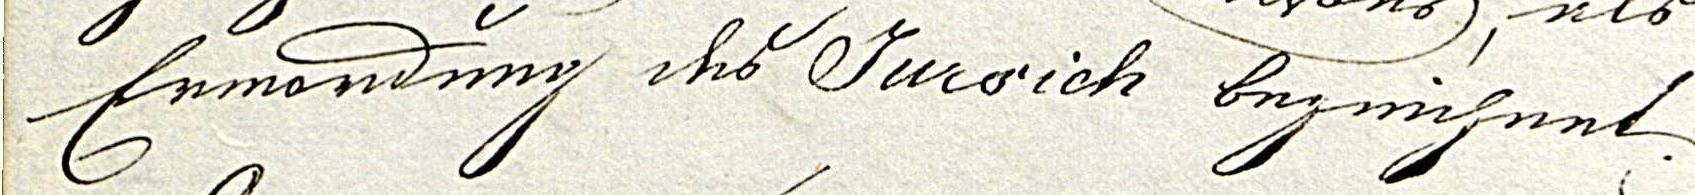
Ermordung des Jursich bezeichnet.
